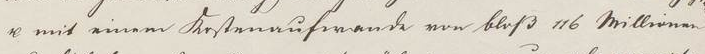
& mit einem Kostenaufwande von bloß 116 Millionen
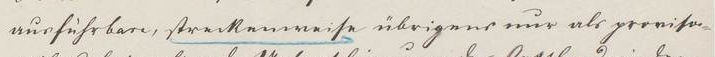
ausführbare, streckenweise übrigens nur als proviso-
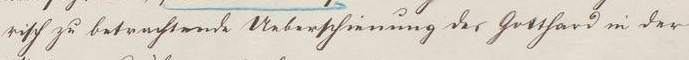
risch zu betrachtende Ueberschienung des Gotthard in der
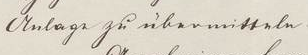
Anlage zu übermitteln.
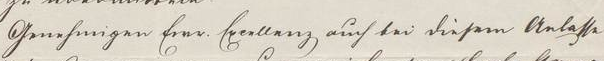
Genehmigen Ewr. Excellenz auch bei diesem Anlasse
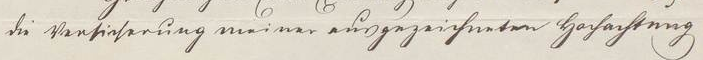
die Versicherung meiner ausgezeichneten Hochachtung
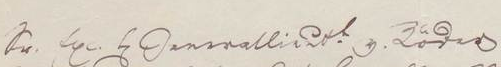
Sr. Exc. Herrn Generallieutt v. Röder
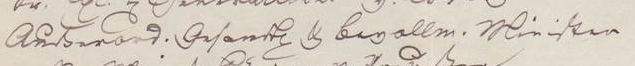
Außerord. Gesandter & bevollm. Minister
